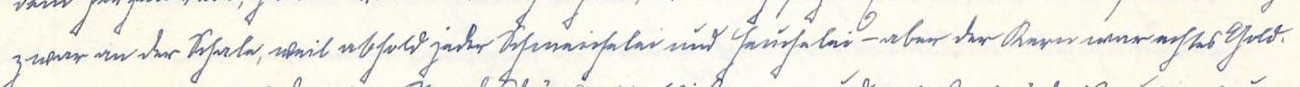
zwar an der Schale, weil abhold jeder Schmeichelei und Heuchelei - aber der Kern war echtes Gold.
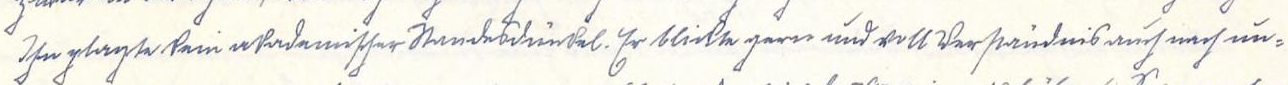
Ihn plagte kein akademischer Standesdünkel. Er blickte gern und voll Verständnis auch nach un-
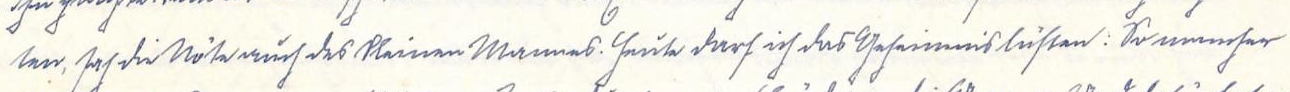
ten, sah die Nöte auch des kleinen Mannes. Heute darf ich das Geheimnis lüften: so mancher
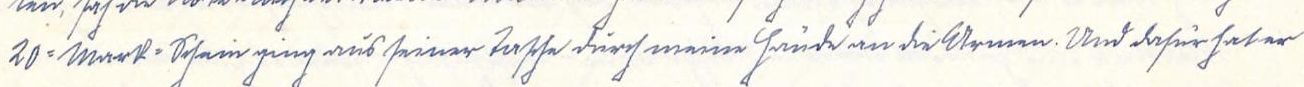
20 – Mark- Schein ging aus seiner Tasche durch meine Hände an die Armen und dafür hat er
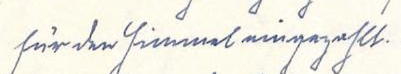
für den Himmel eingezahlt.
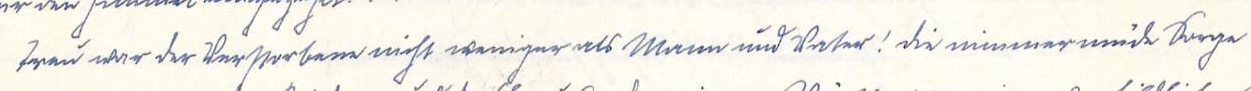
Treu war der Verstorbene nicht weniger als Mann und Vater! Die nimmermüde Sorge
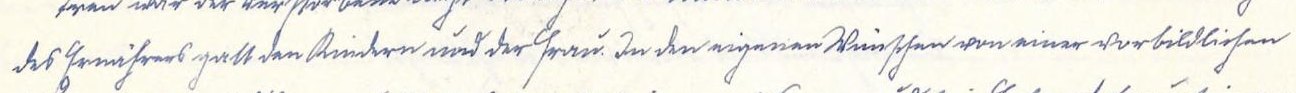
des Ernährers galt den Kindern und der Frau. In den eigenen Wünschen von einer
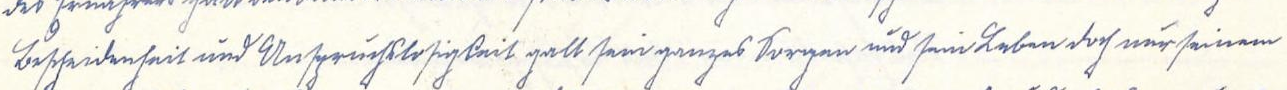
vorbildlichen Bescheidenheit und Anspruchslosigkeit galt sein ganzes Sorgen und sein Leben doch nur seinem
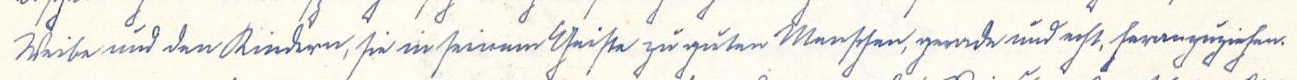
Weibe und den Kindern, sie in seinem Geiste zu guten Menschen, gerade und echt, heranzuziehen.
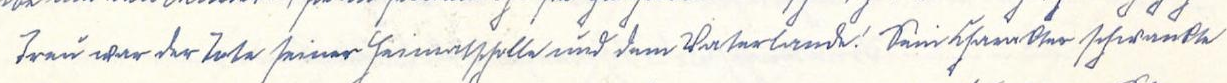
Treue war der Tote seiner Heimatsscholle und dem Vaterland! Sein Charakter schwankte
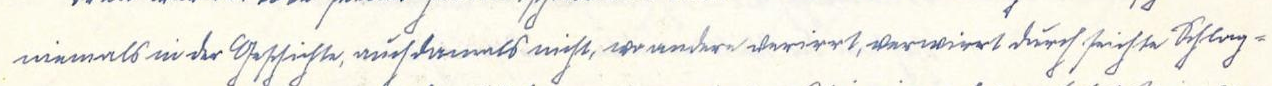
niemals in der Geschichte, auch damals nicht, wo andere verwirrt, verwirrt durch seichte Schlag-
